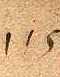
115
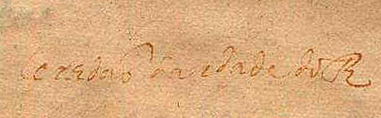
Certidaõ da idade do R
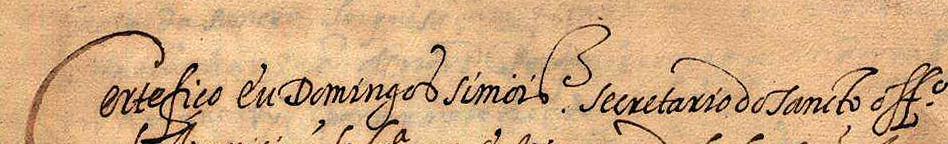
Certefico eu Domingos simois secretario do sancto off.o
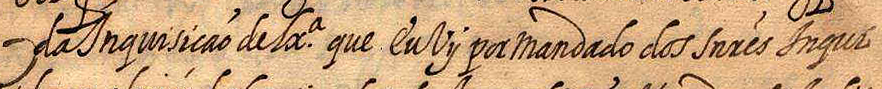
da Inquisição de lx.a que eu vy por mandado dos snrēs Inqui
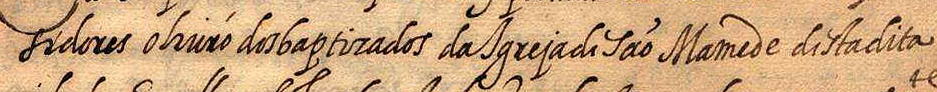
sidores o liuro dos baptizados da Igreja de Saõ Mamede desta dita
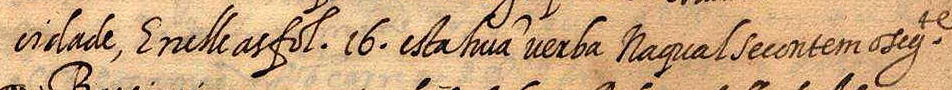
cidade, E nelle as fol. 16. esta huā uerba na qual se contem o seg.te
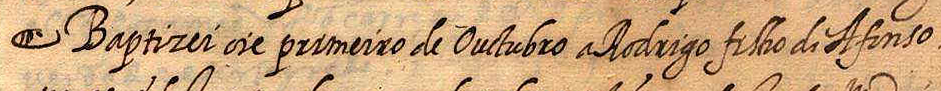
e Baptizei oie primeiro de Outubro a Rodrigo filho de Afonso
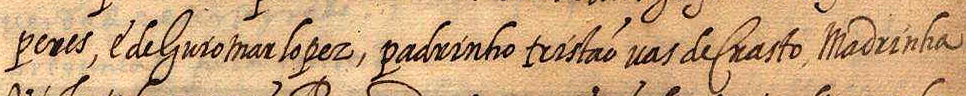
peres, e de Guiomar lopez, padrinho tristaõ uas de Crasto madrinha
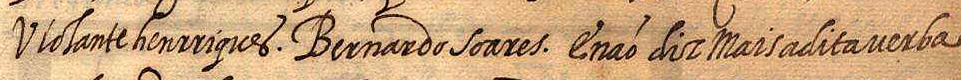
Violante henrriques. Bernardo soares. E naõ diz mais a dita uerba
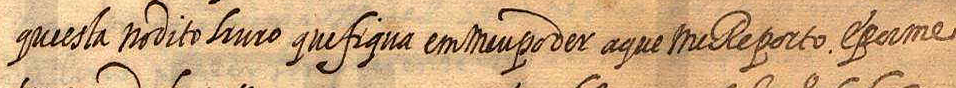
que esta no dito liuro que fiqua em meu poder a que me Reporto E por me
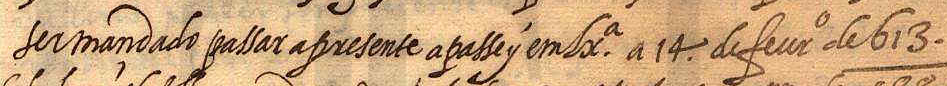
ser mandado passar a presente a passey em lx.a a 14. de feuro de 613.
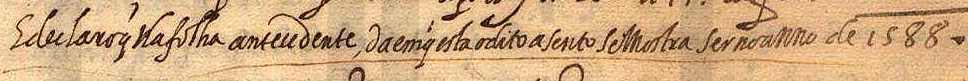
E declaro q̄ na folha antecedente, da em q̄ esta o dito asento se Mostra ser no anno de 1588.
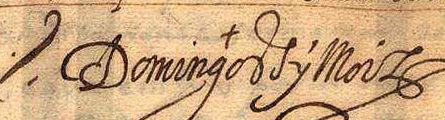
Domingos symois
